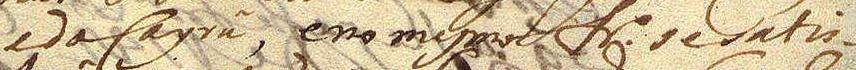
e do Cayrũ , e no mesmo fr.o se satis
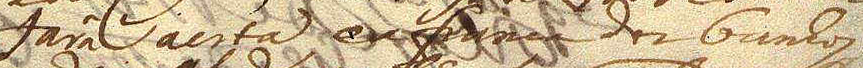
fará a esta en fiança dos banhos
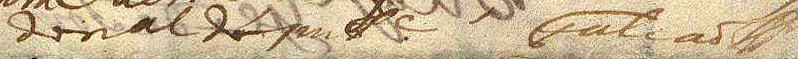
do nal do _ P.e Falcaõ
